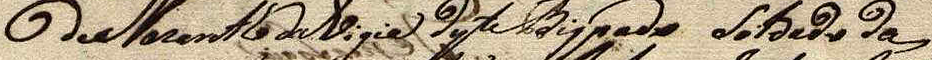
de Nazaretho de Vigia deste Bispado soldado da
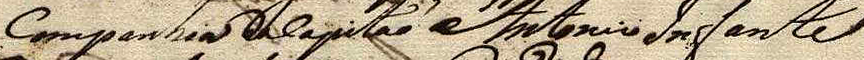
Companhia do Capitaõ Antonio Infante
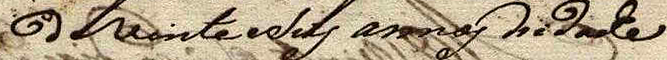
de vinte e seis annos de idade
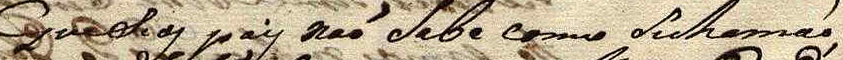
Que Seos pais naõ sabe como se chamaõ
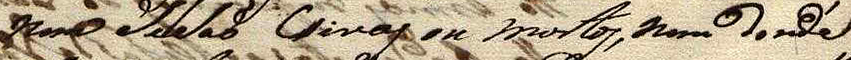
nem se saõ vivos ou mortos, nem donde
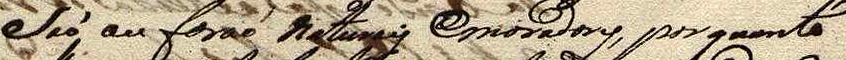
saõ ou foraõ naturais e moradores, porquanto
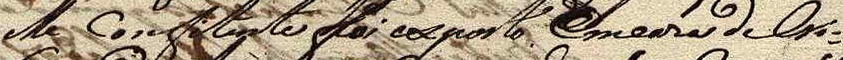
elle confitente foi exposto. em casa de Cro
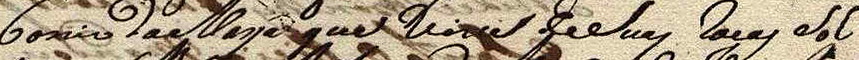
bonio da Maya que vive de suas Rocas sol
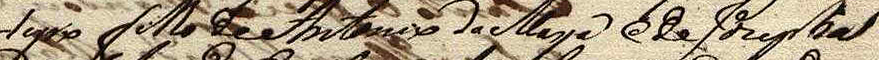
teyro filho de Antonio da Maya e de Jozepha
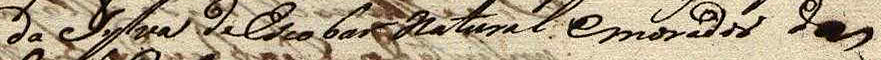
da Sylva de Escobar natural e morador da
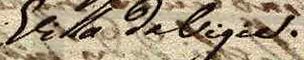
Villa da Vigia.
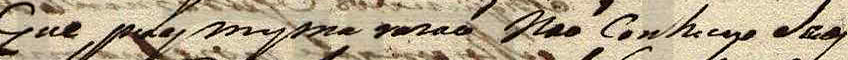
Que pelos mesma razaõ naõ conheceu seos
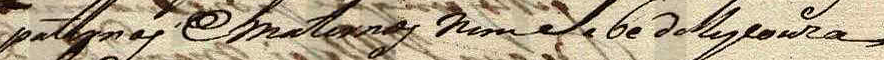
paternos e maternos nem sabe delles couza
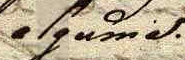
alguma.
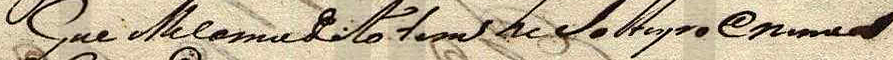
Que elle como dito tem he solteyro e nunca
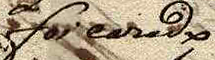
foi cazado
